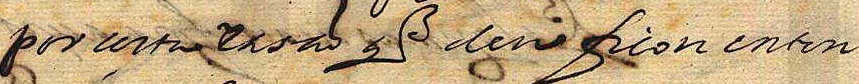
por certa rasaõ q̄ deu ficou enten
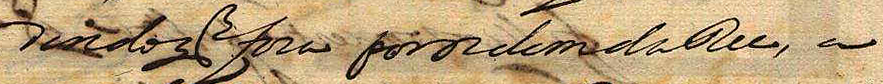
dendo q̄ fora por ordem da Ree, a
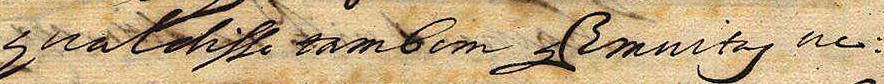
qual disse tambem q̄ muitas ue
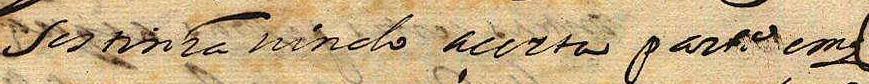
ses tinha uindo a certa parte em q̄
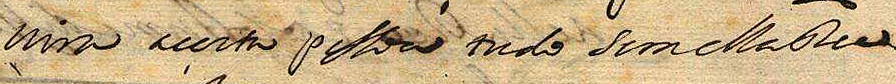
uira a certa pessoa tudo sem ella Ree
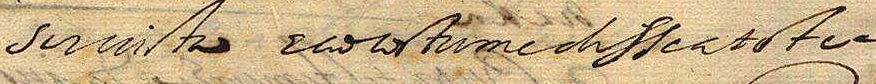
ser uista E ao custume disse a teste
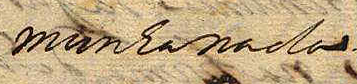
munha nada
